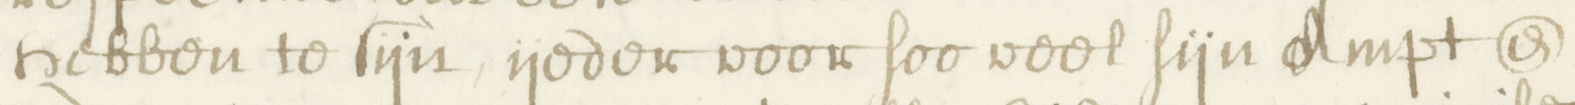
hebben te sijn, ijeder voor soo veel sijn Ampt &
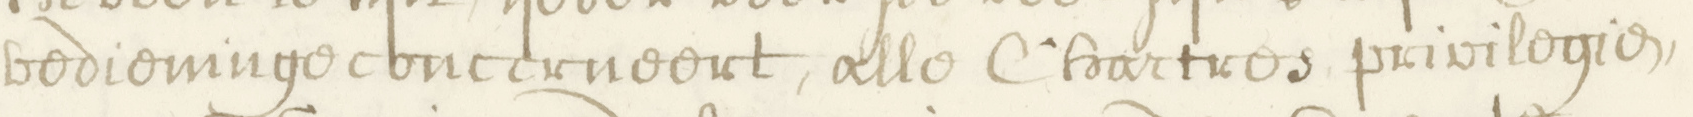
bedieninge concerneert, alle Chartres, privilegien,
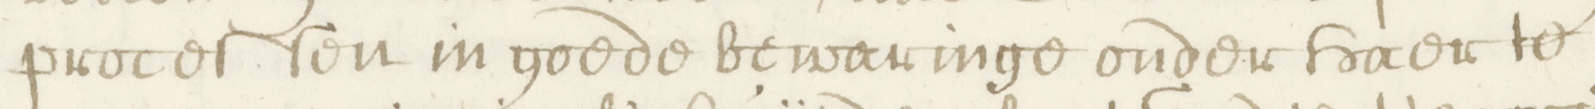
processen in goede bewaringe onder haer te
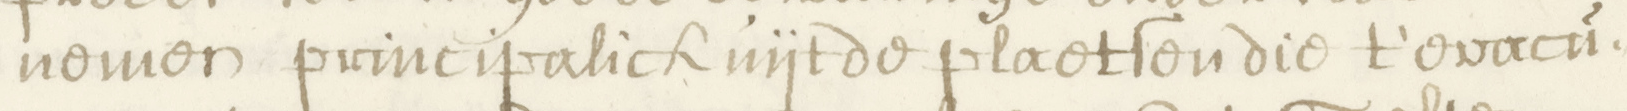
nemen, principalick uijt de plaetsen die t'evacu„
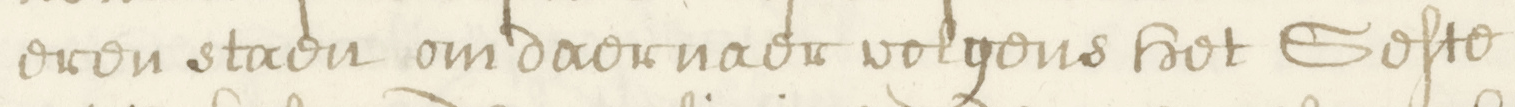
eren staen om daernaer volgens het Seste
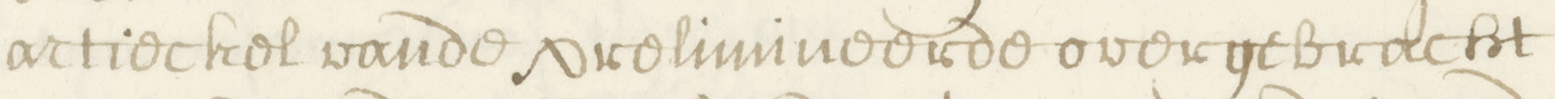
artieckel vande prelimineerde overgebracht
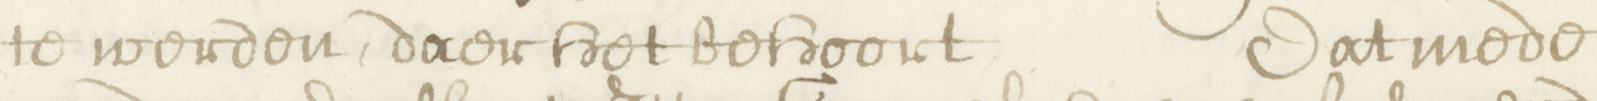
te werden, daer het behoort. Datmede
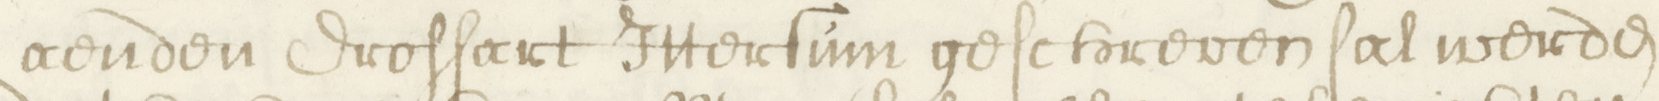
aenden Drossart Ittersum geschreven sal werden
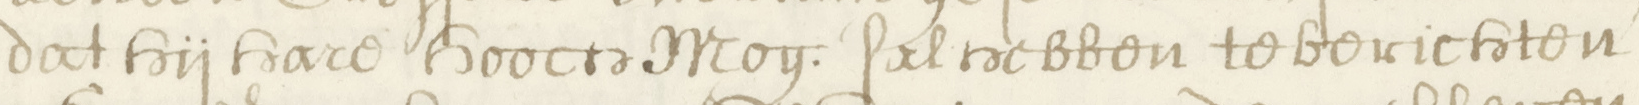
dat hij hare hooch Mog: sal hebben te berichten
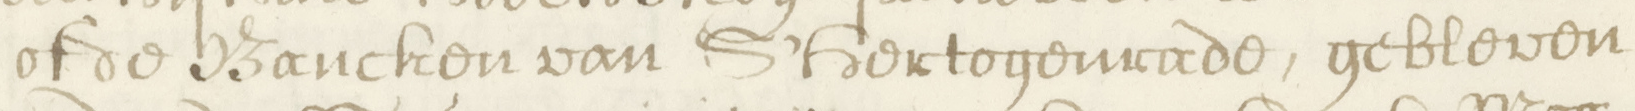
of de Bancken van S'Hertogenrade, gebleven
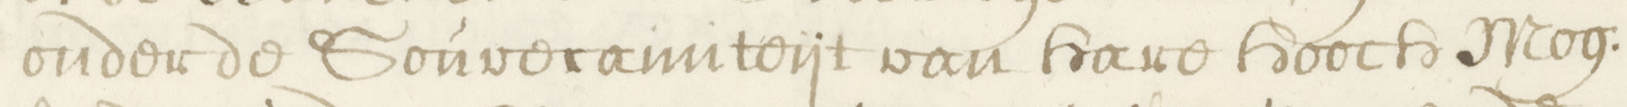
onder de Souverainiteijt van hare hooch Mog:
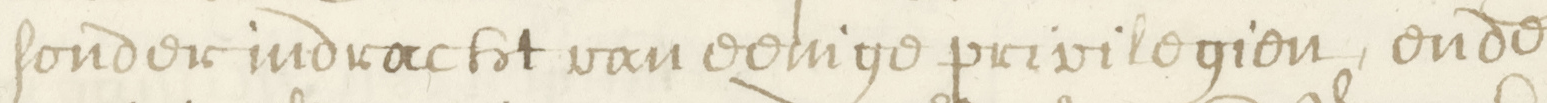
sonder indracht van eenige privilegien, ende
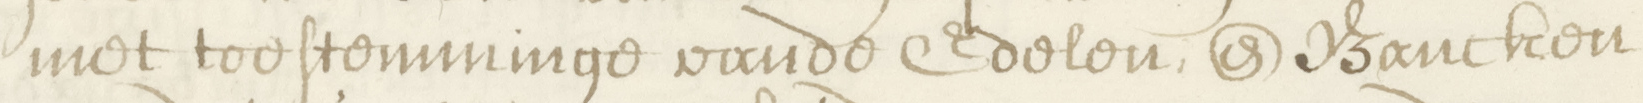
met toestemminge vande Edelen, & Bancken
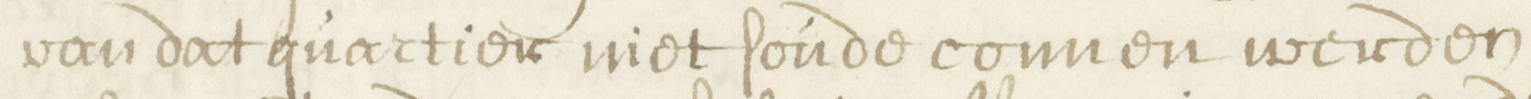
van dat quartier niet soude connen werden
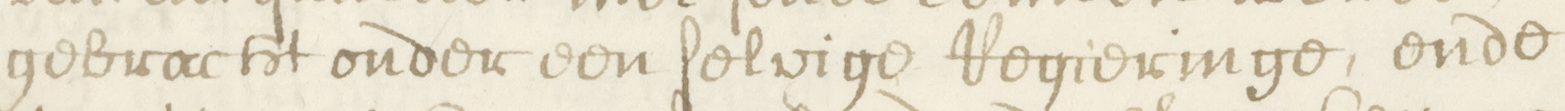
gebracht onder een selvige Regieringe, ende
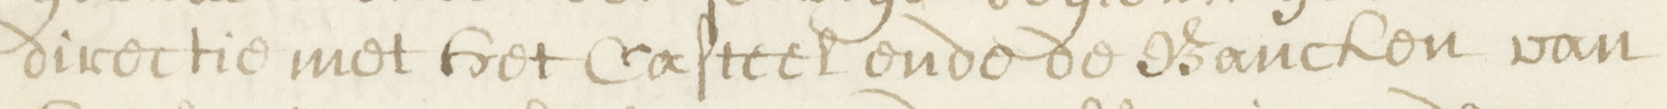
directie met het Casteel ende de Bancken van
